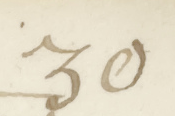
30
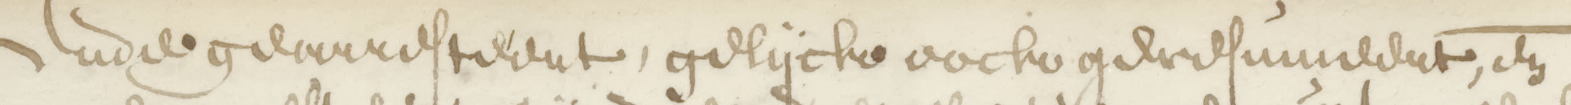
ende gearresteert, gelijck oock geresumeert, en
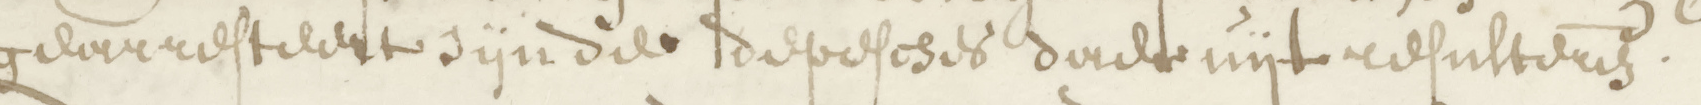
gearresteert sijn de depesches daer uijt resulteren.
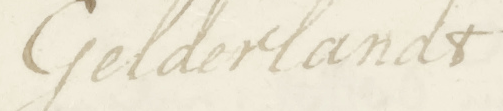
Gelderlandt
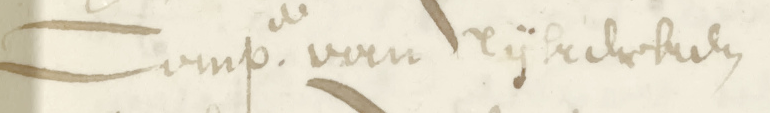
Compe van Nijkercken
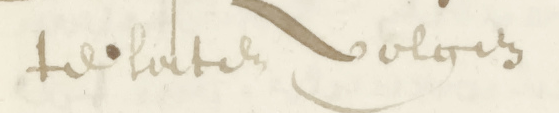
te laten volgen
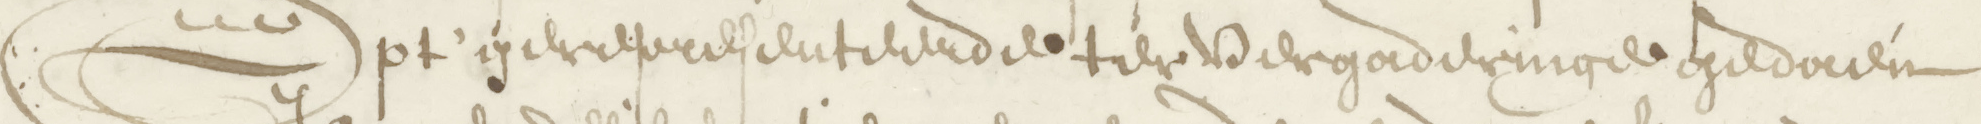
Opt‛ gerepresenteerde ter Vergaderinge gedaen
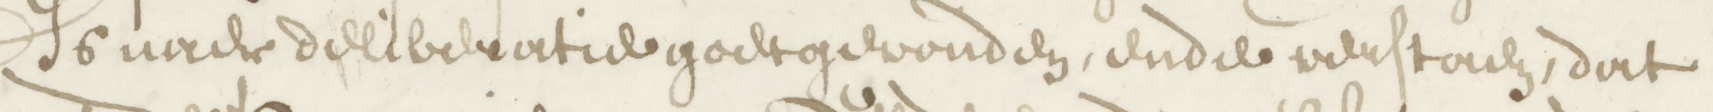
Is naer deliberatie goetgevonden, ende verstaen, dat
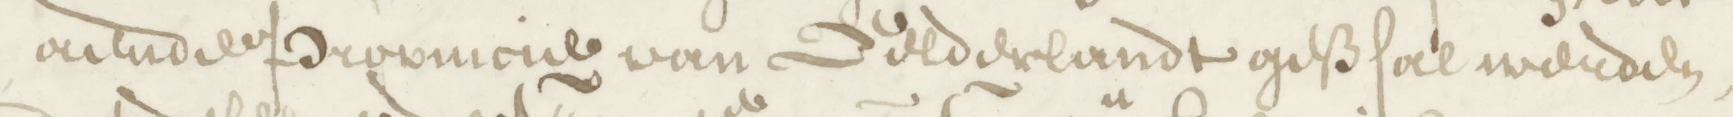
aende Provincie van Gelderlandt ges sal werden
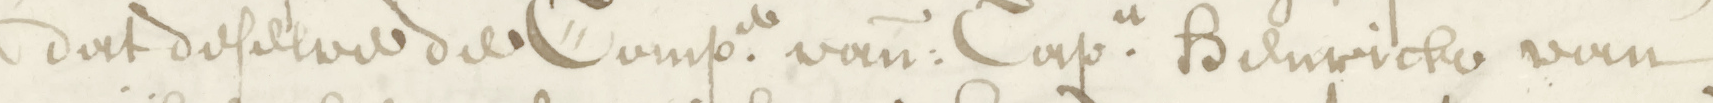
dat deselve de Compe van Capn Henrick van
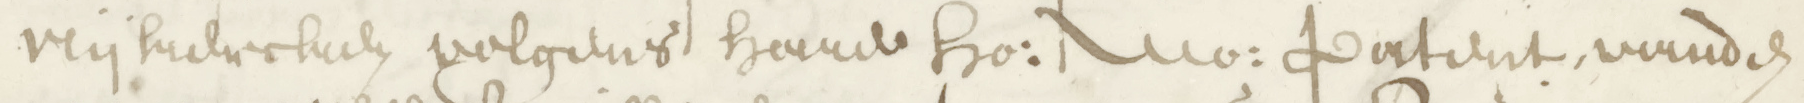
Nijkercken volgens hare Ho:Mo: patent, vanden
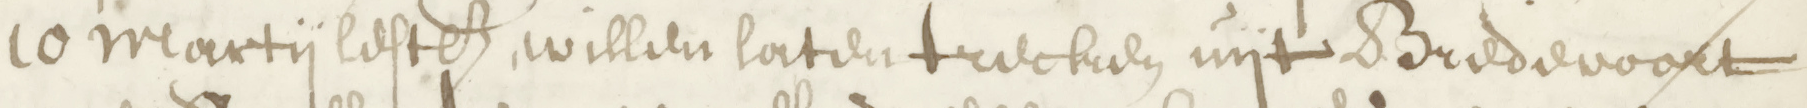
10 Martij lestl, willen laten trecken uijt Bredevoort
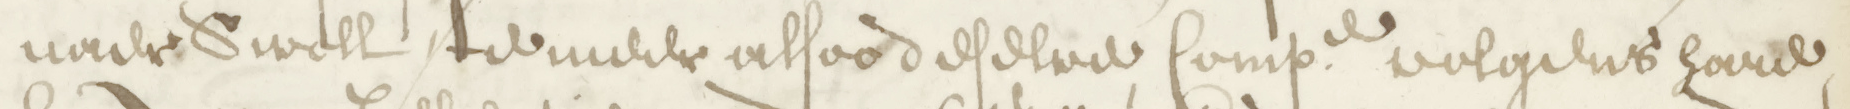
naer Swoll, te meer alsoo deselve Compe volgens hare
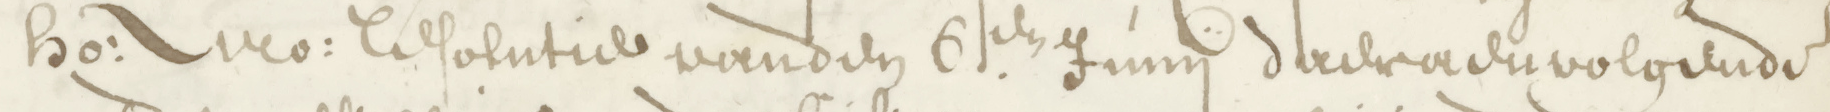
Ho:Mo: resolutie vanden 6en Junij daeraenvolgende
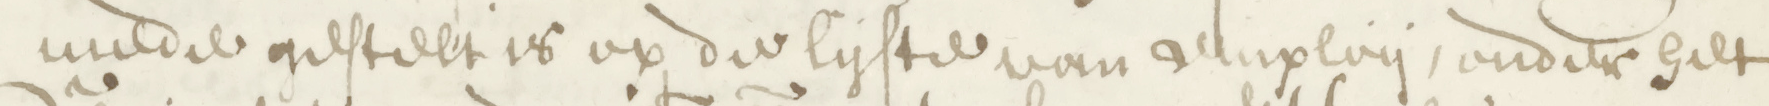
mede gestelt is op de lijste van emploij, onder het
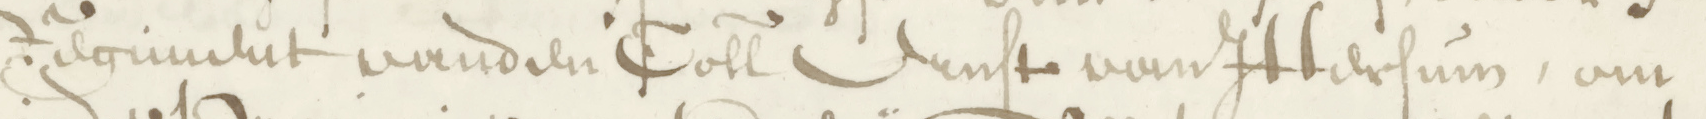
Regiment vanden Coll Ernst van Ittersum, om
